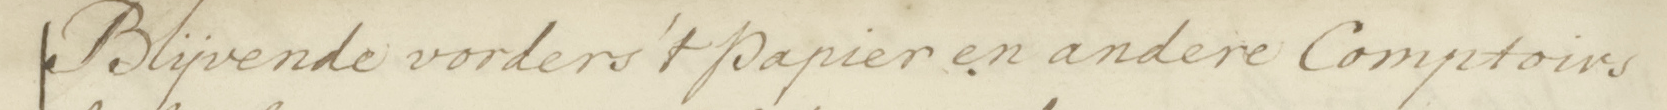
Blijvende vorders 't Papier en andere Comptoirs
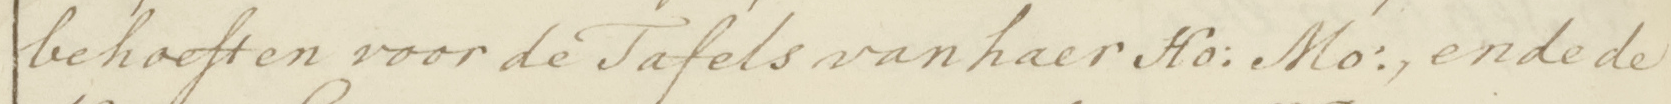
behoeften voor de Tafels van haer Ho:Mo:, ende de
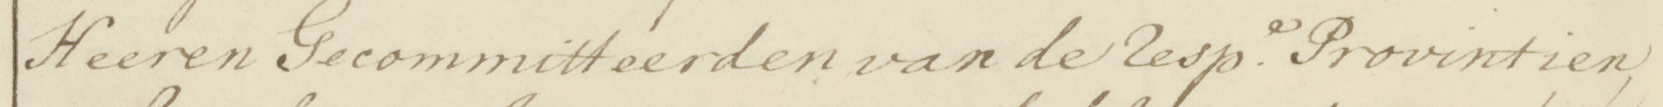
Heeren Gecommitteerden van de Respe. Provintien,
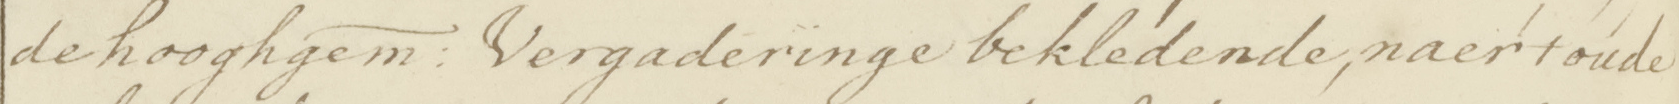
de hooghgem: Vergaderinge bekledende, naer t‛oude
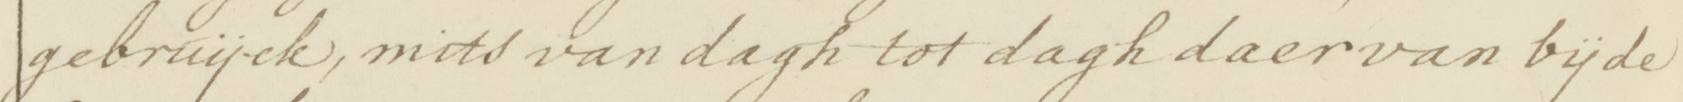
gebruijck, mits van dagh tot dagh daer van bij de
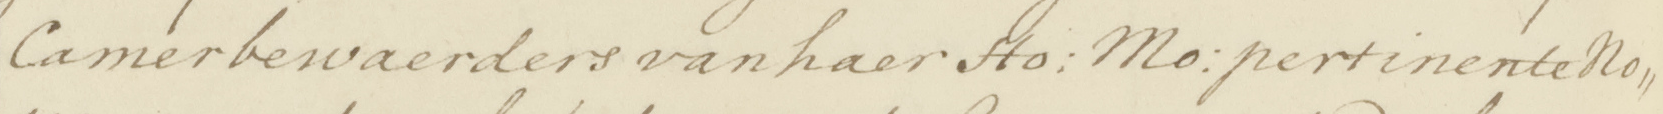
Camerbewaerders van haer Ho:Mo: pertinente No„
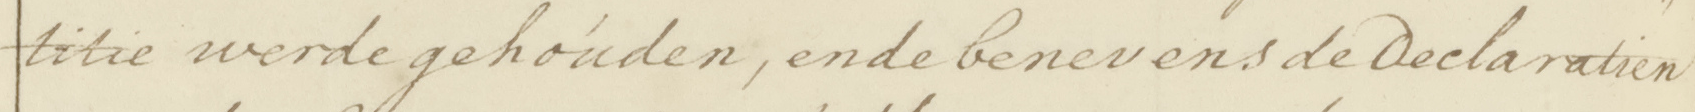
titie werde gehouden, ende benevens de declaratien
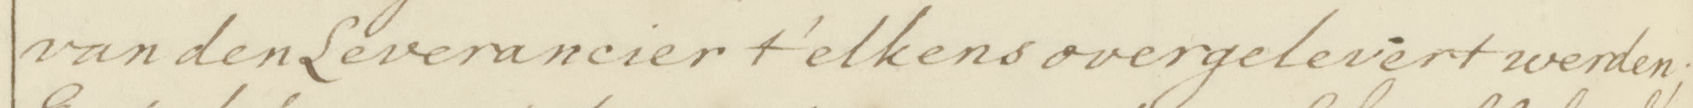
van den Leverancier t'elkens overgelevert werden.
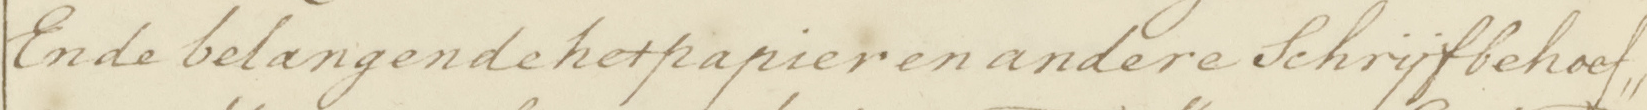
Ende belangende het papier en andere Schrijfbehoef„
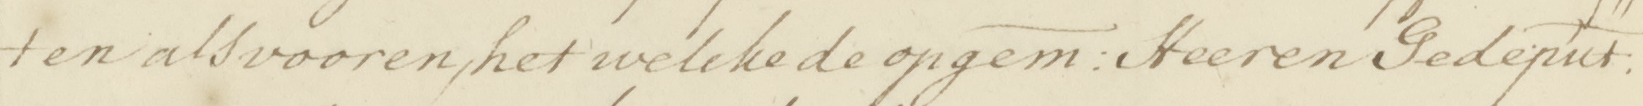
ten alsvooren, het welcke de opgem: Heeren Gedeput.
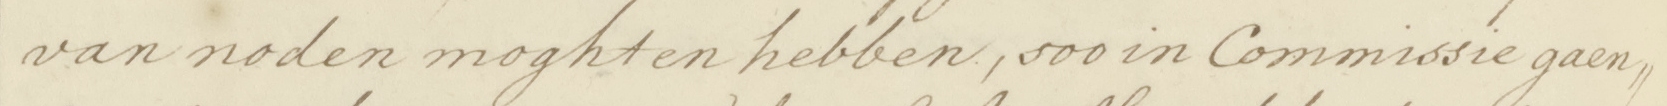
van noden moghten hebben, soo in Commissie gaen„
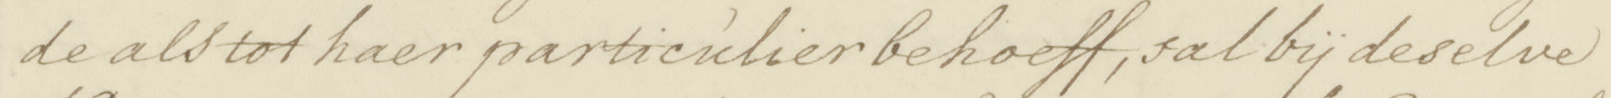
de als tot haer particulier behoeff, sal bij deselve
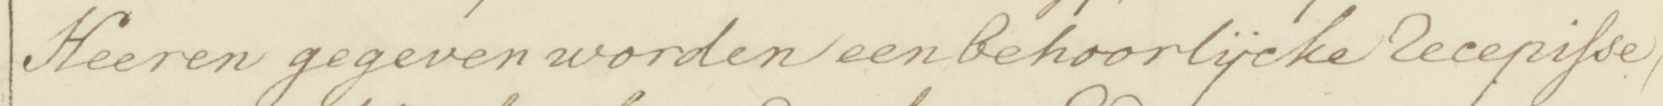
Heeren gegeven worden een behoorlijcke recepisse,
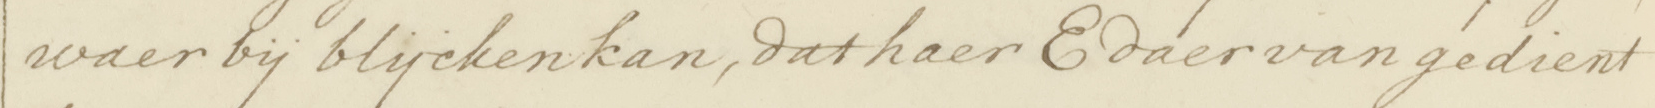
waer bij blijcken kan, dat haer E daer van gedient
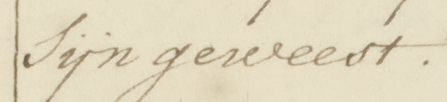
sijn geweest.
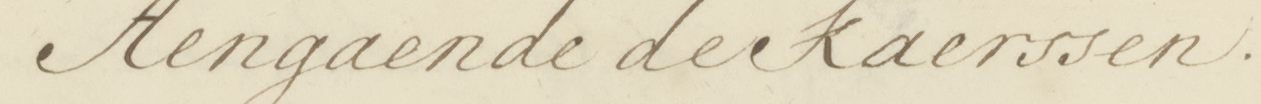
Aengaende de Kaerssen.
